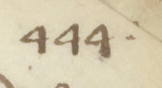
444.
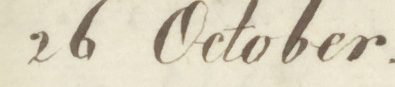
26 October
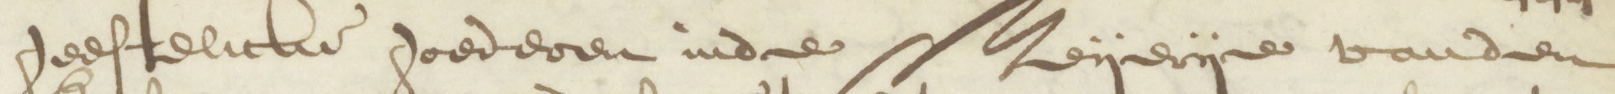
geestelicke goederen inde Meijerije vanden
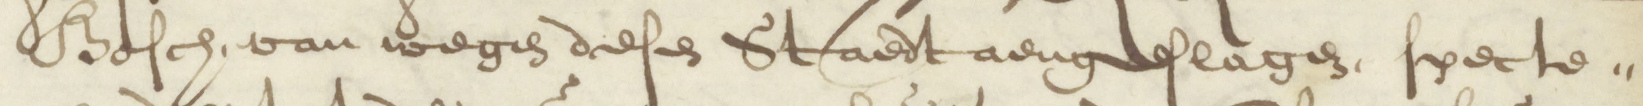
Bosch, van wegen desen Staedt aengeslagen, specte„
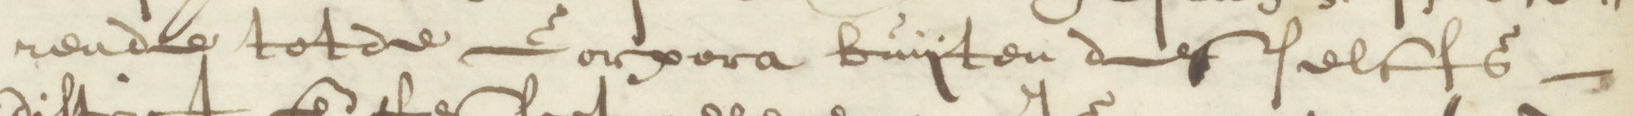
rende tot de Corpora buijten deselffs —
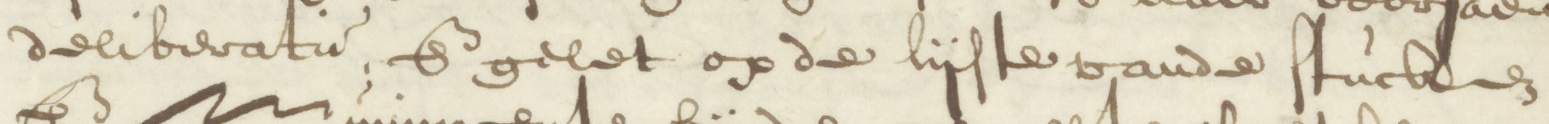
deliberatie, & gelet op de lijste vande stucken
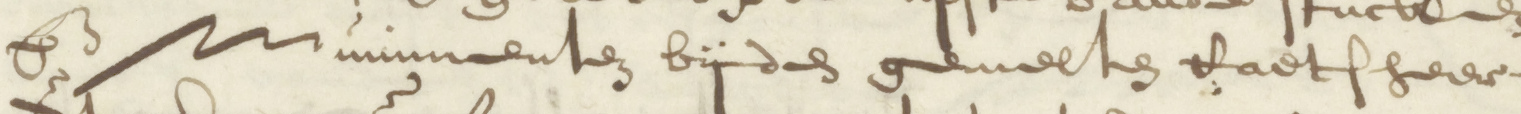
& munimenten bij den gemelten Raetsheer
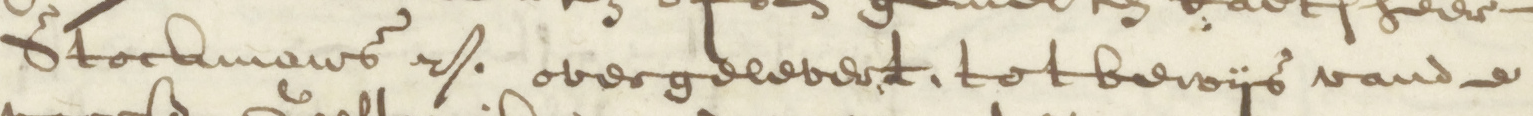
Stockmans r. overgelevert, tot bewijs vande
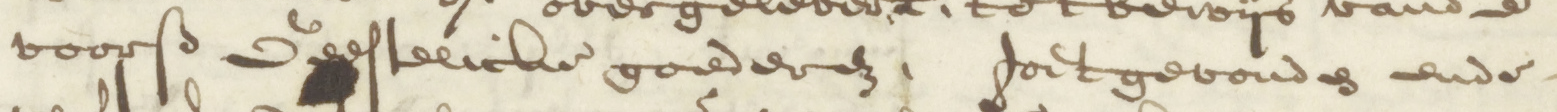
voors Geestelicke goederen, goetgevonden ende
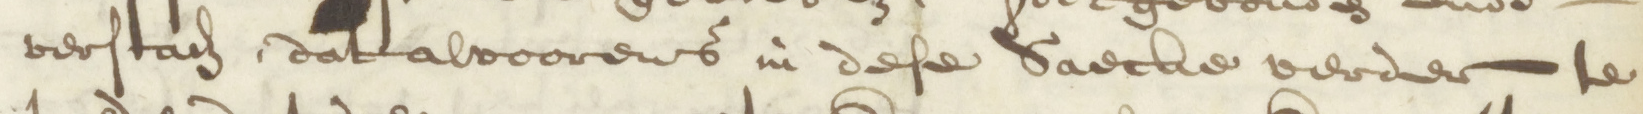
verstaen, dat alvoorens in dese Saecke verder te
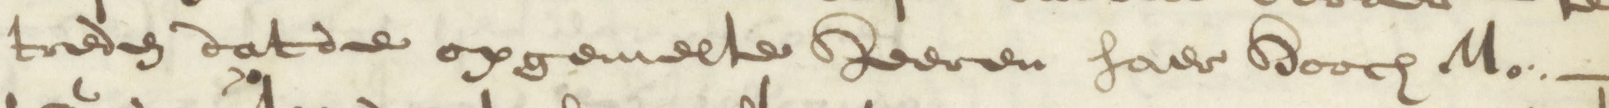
treden dat de opgemelte Heeren haer Hooch Mo:—
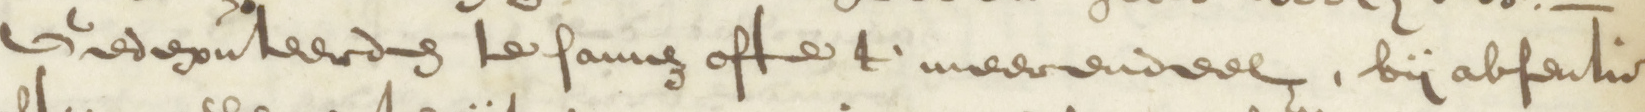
Gedeputeerden te samen ofte t' meerendeel, bij absentie
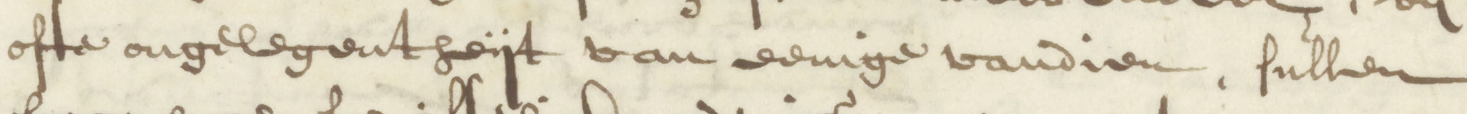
ofte ongelegentheijt van eenige vandien, sullen
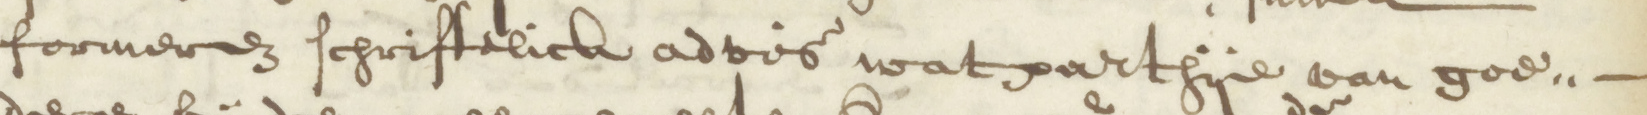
formeren schriftelick advis wat parthije van goe„ —
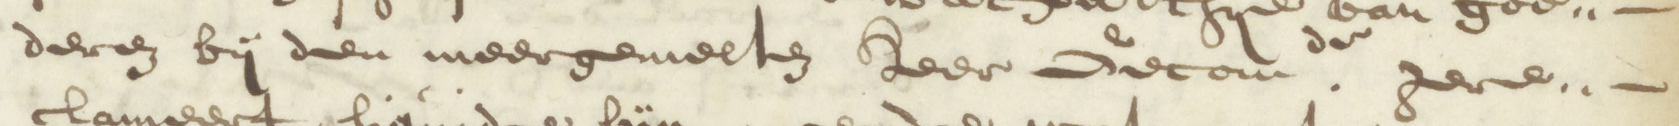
deren bij den meergemelten Heer Gecomde. gere„
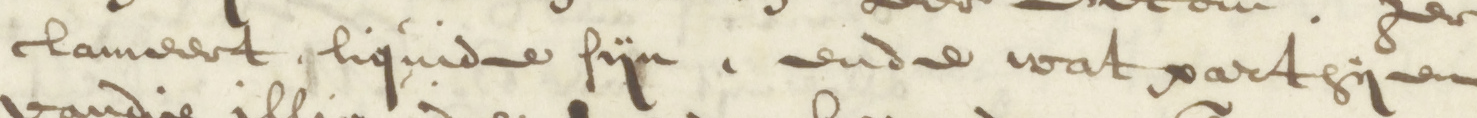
clameert, liquide sijn, ende wat parthijen
